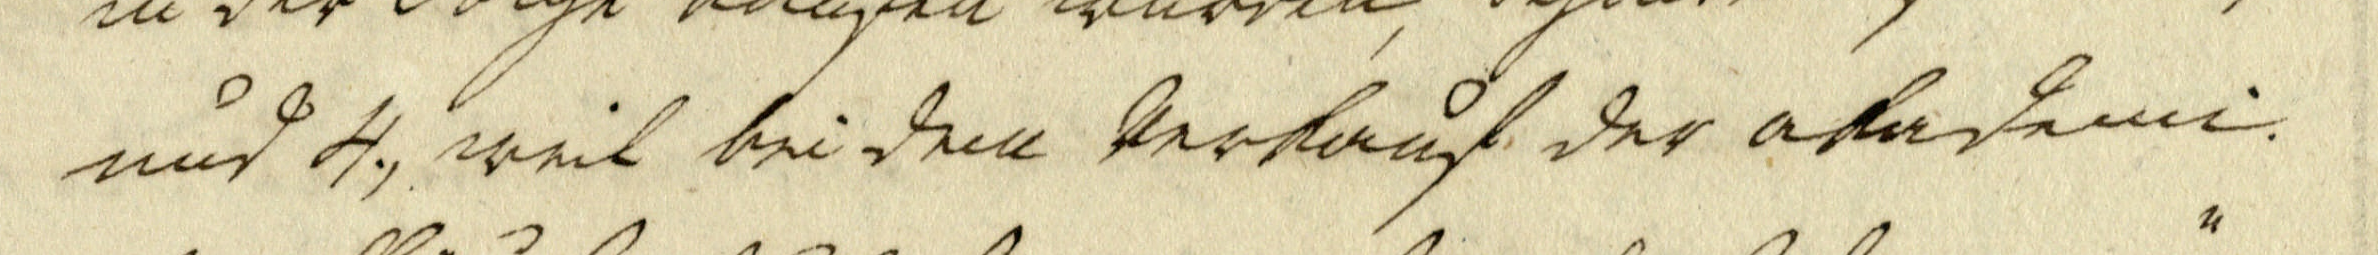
und 4., weil bei dem Verkauf der akademi¬
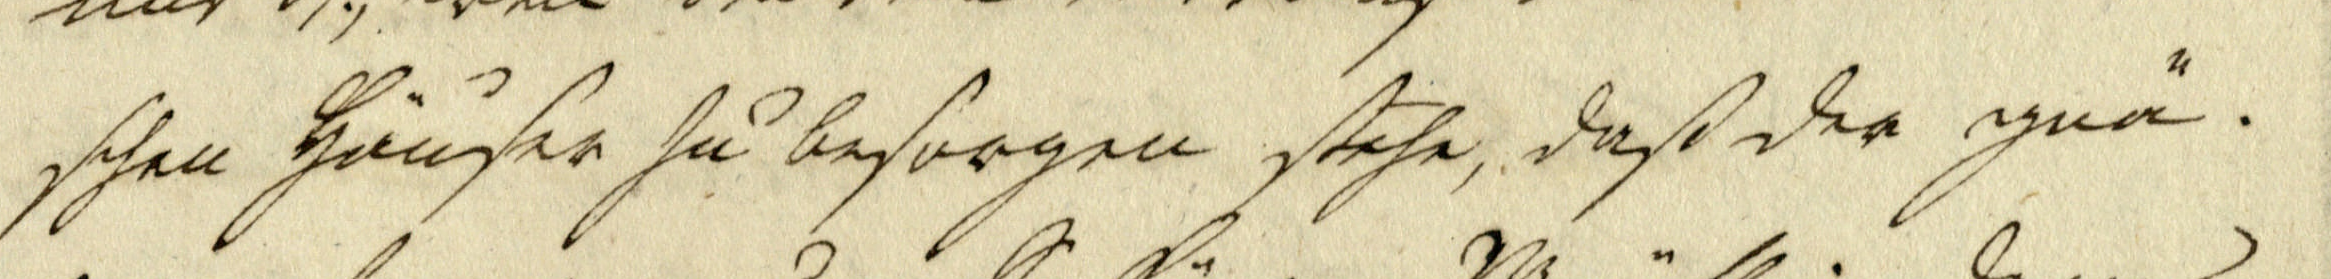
schen Häuser zu besorgen stehe, daß der gnä¬
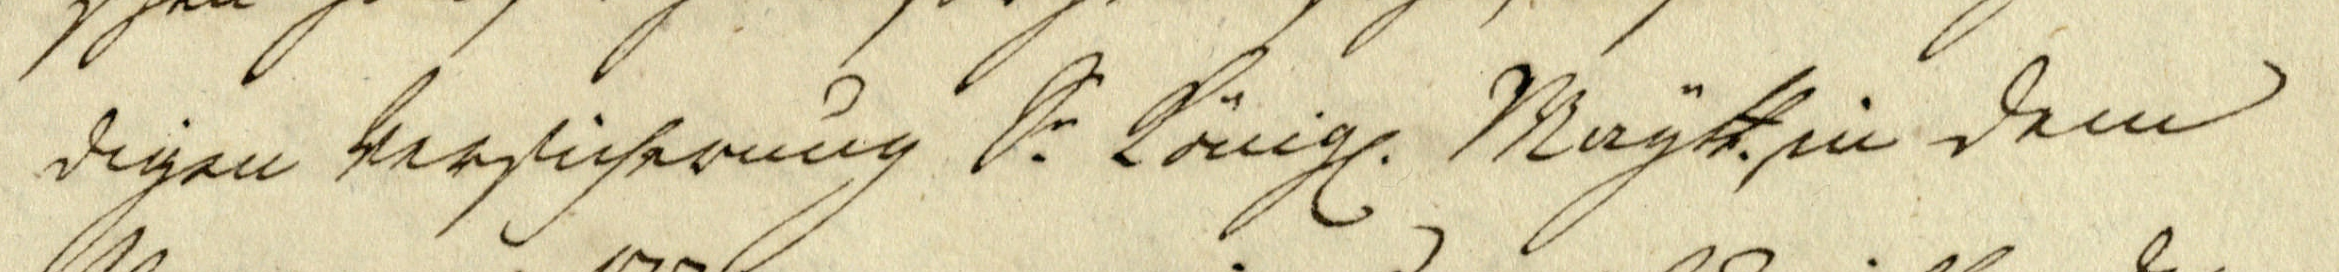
digen Versicherung Sr. Königl. Maÿtt. in dem
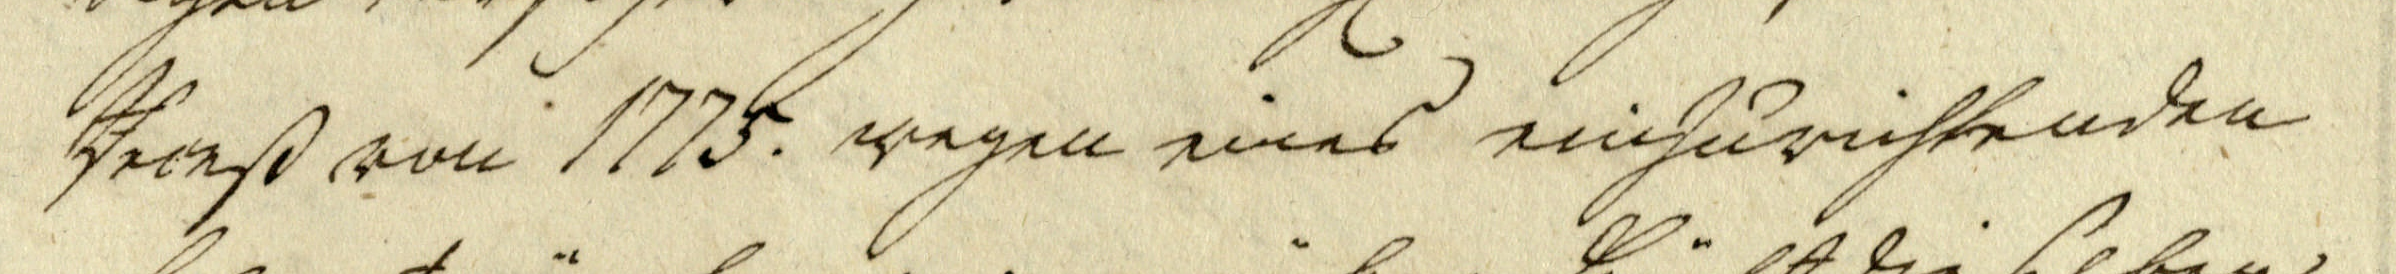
Receß von 1775. wegen eines einzurichtenden
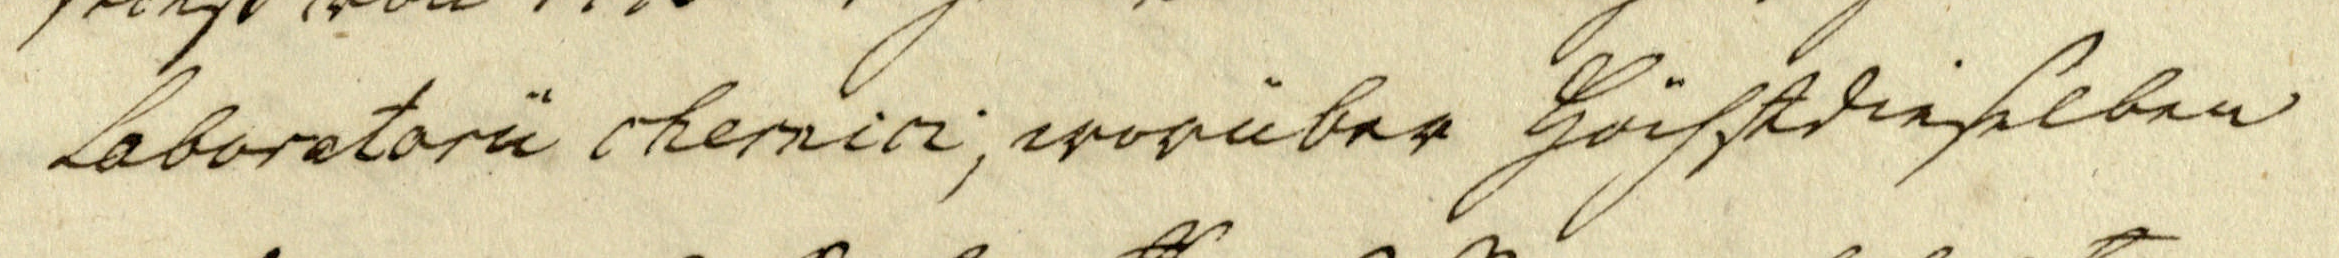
Laboratorii chemici, worüber Höchstdieselben
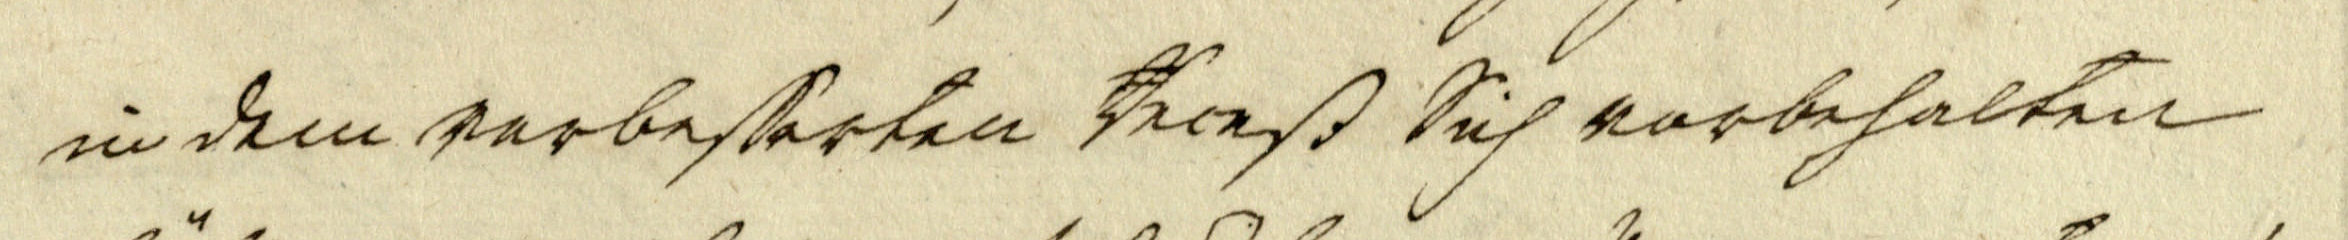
in dem verbesserten Receß Sich vorbehalten
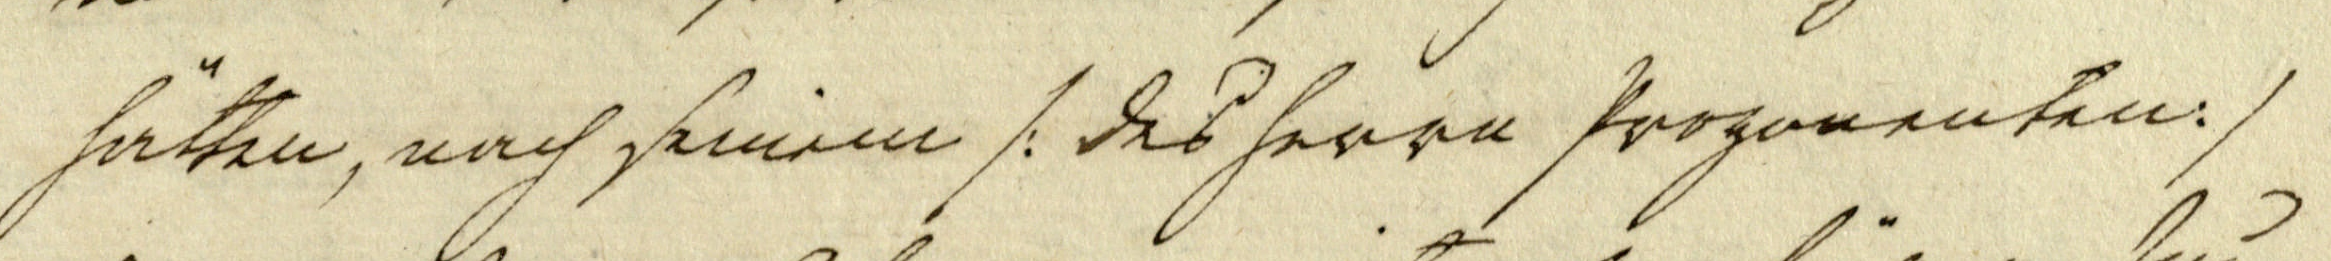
hätten, nach seinem /: des Herrn Proponenten ./
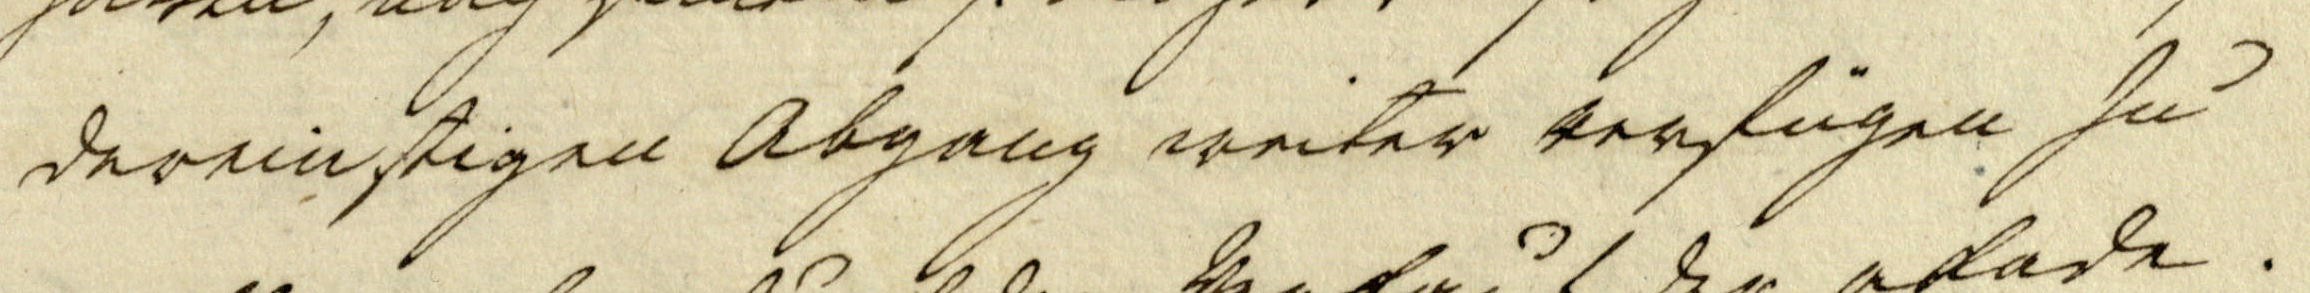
dereinstigen Abgang weiter verfügen zu
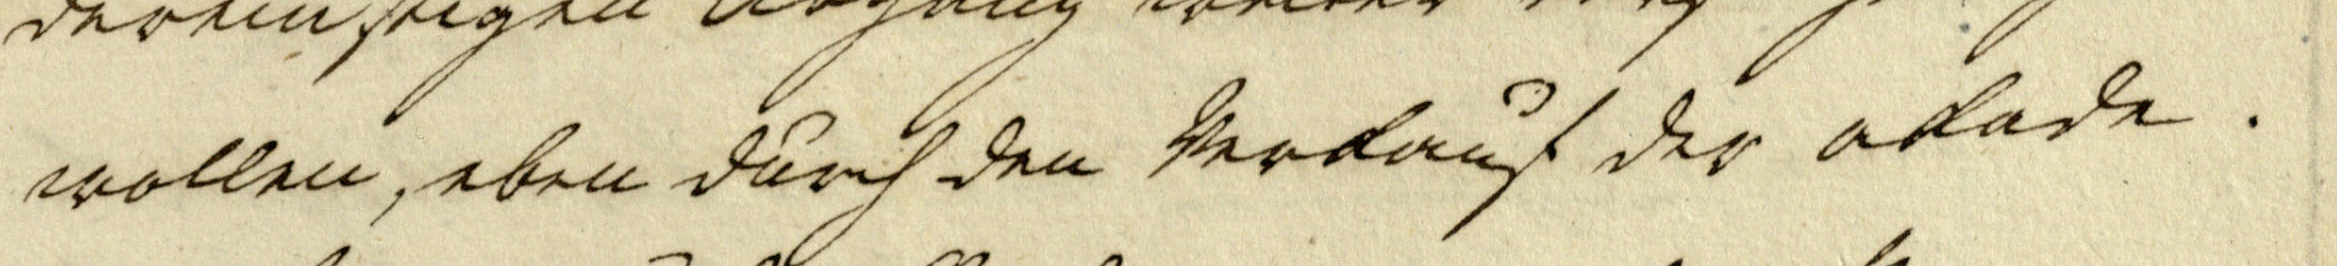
wollen, eben durch den Verkauf der akade¬
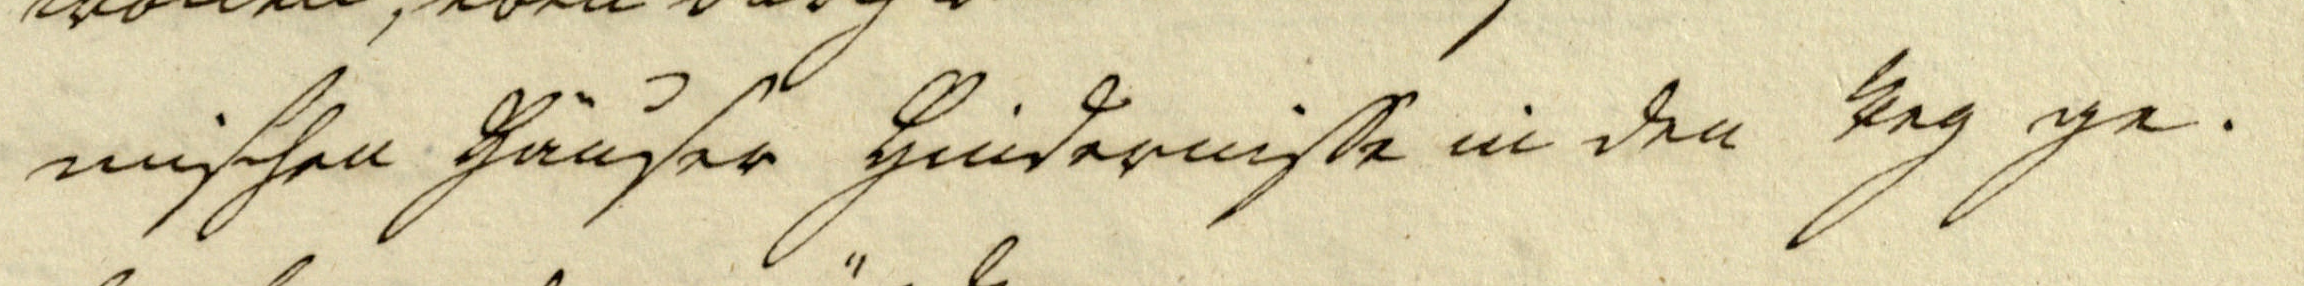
mischen Häuser Hindernisse in den Weg ge¬
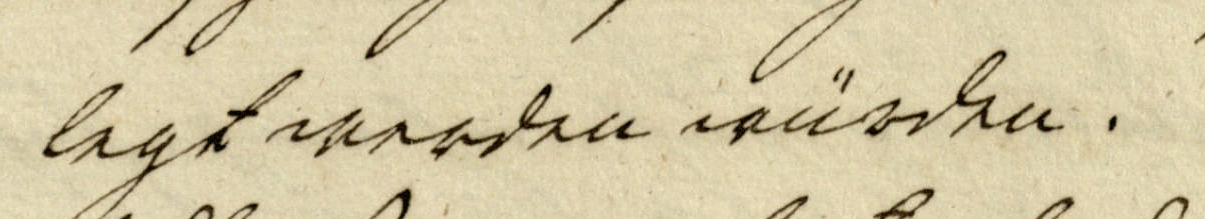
legt werden würden.
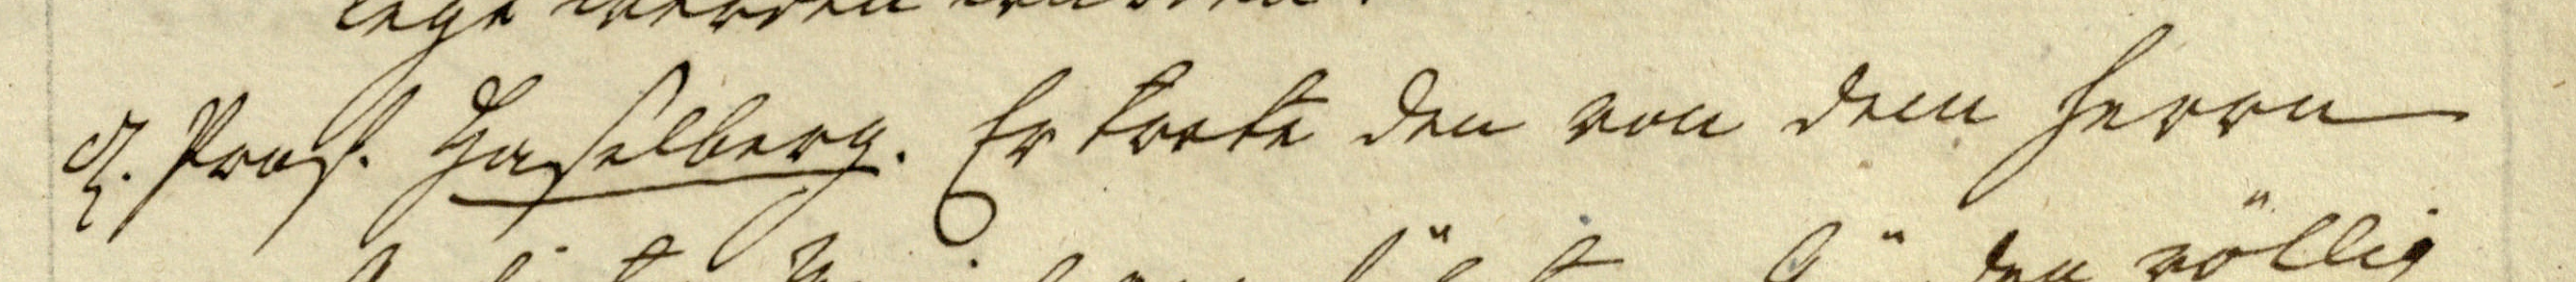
dh. Prof. Haselberg. Er trete den von dem Herrn
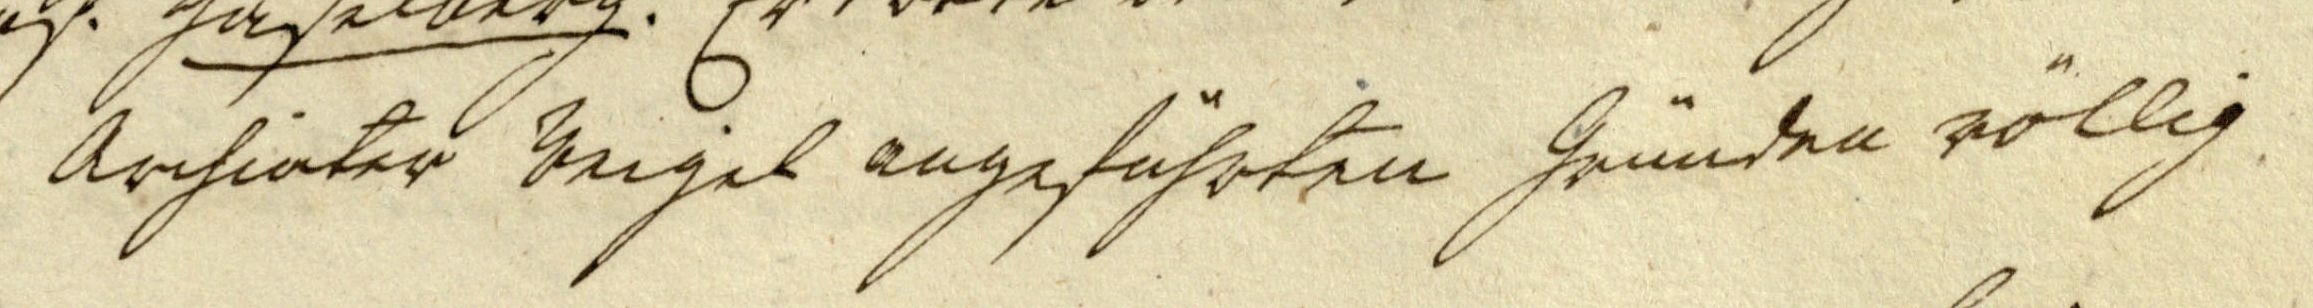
Archiater Weigel angeführten Gründen völlig
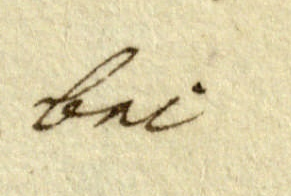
bei.
